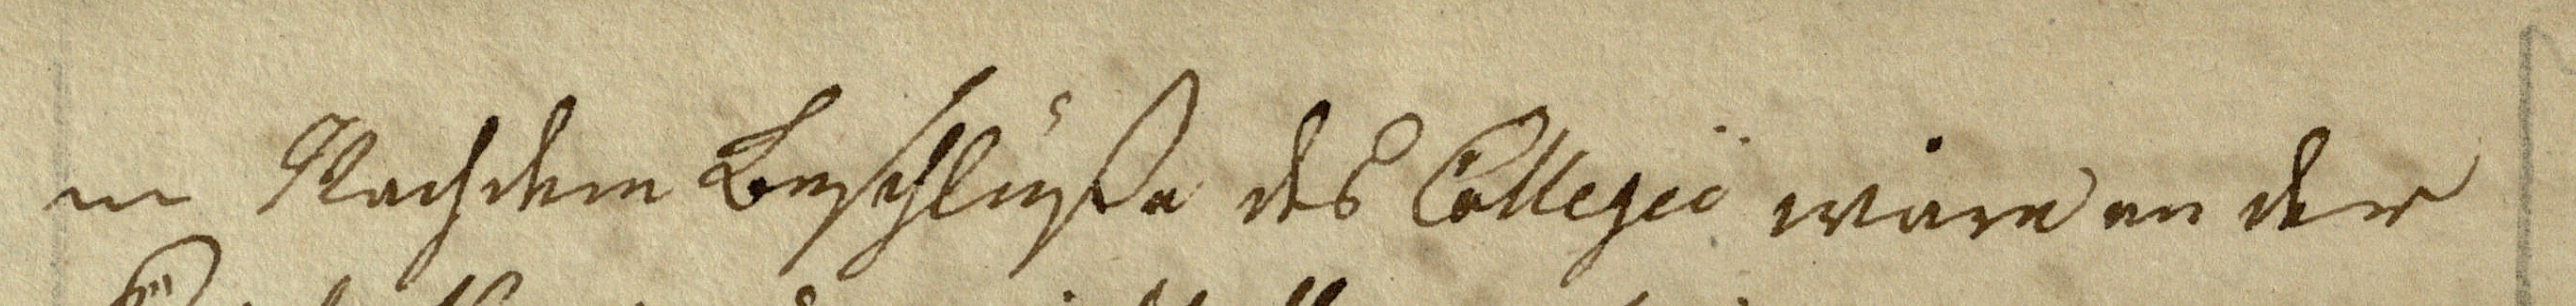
Nach dem Beschluß des Collegio wäre an der
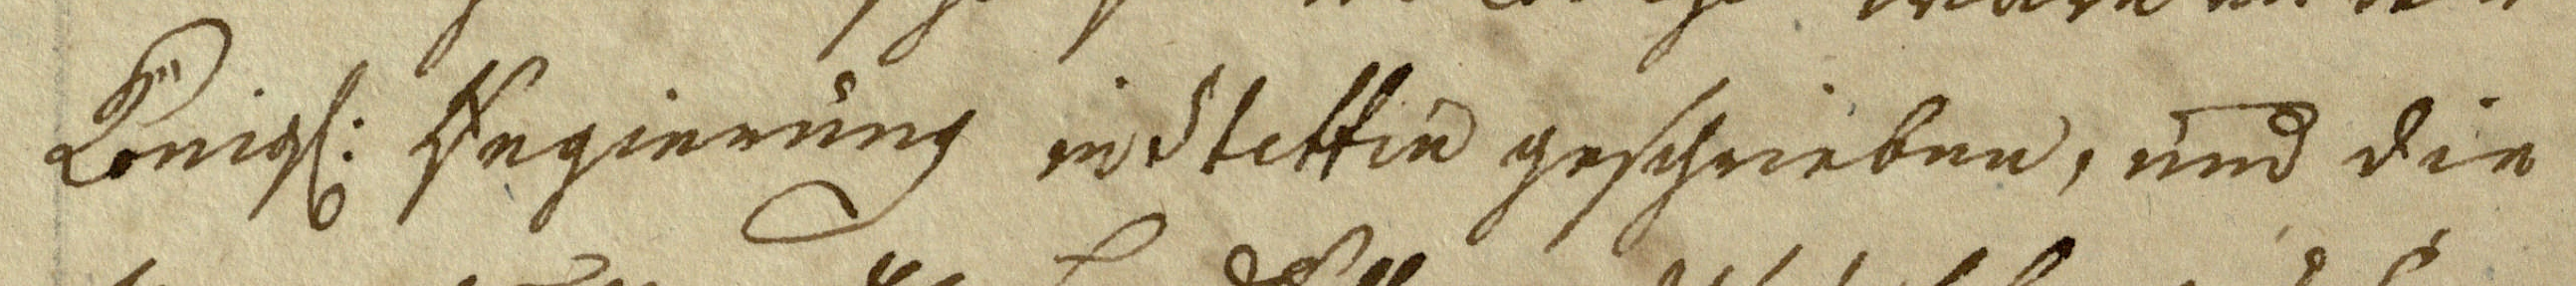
Königl. Regierung in Stettin geschrieben, und die
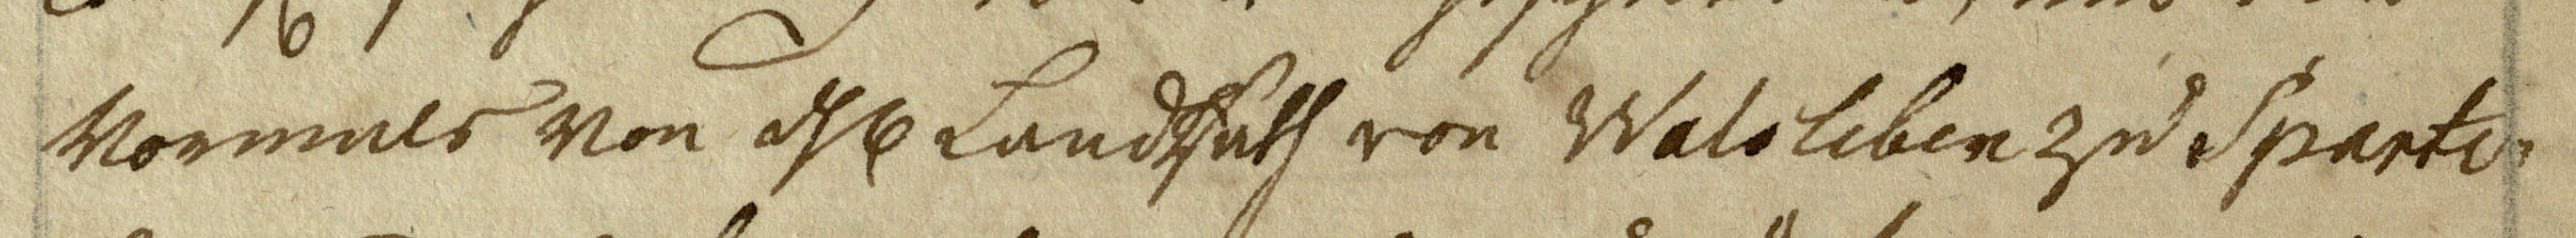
vormals von dh LandRath von Walsleben zu Spante¬
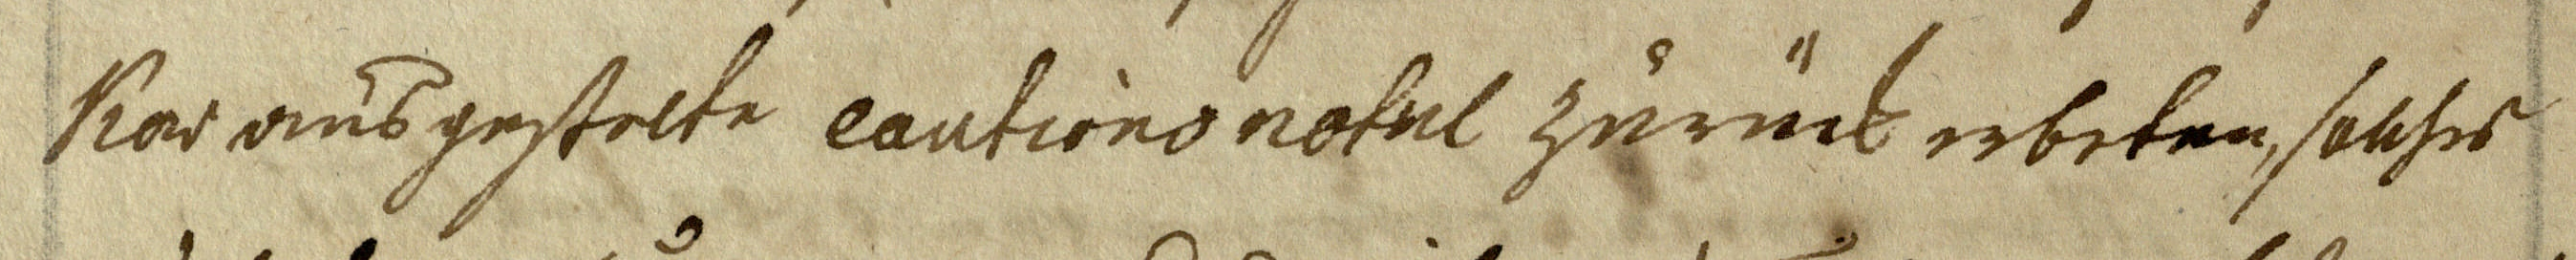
kow aus gestelte Cautions notul zurück erbeten, solches
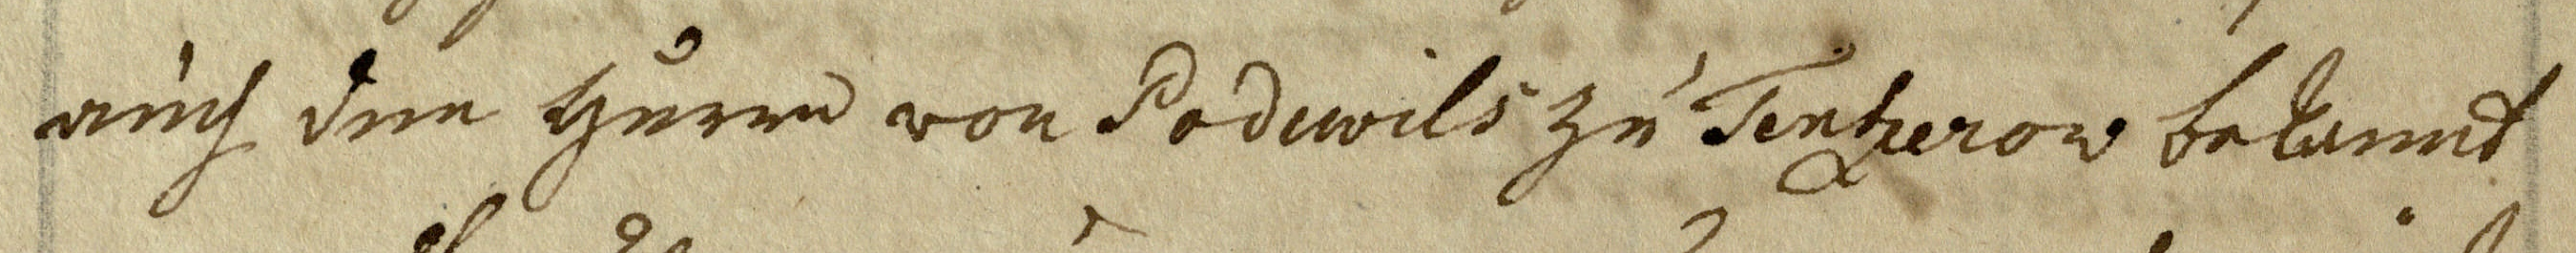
auch dem Herrn von Podewils zu Tentzerow bekannt
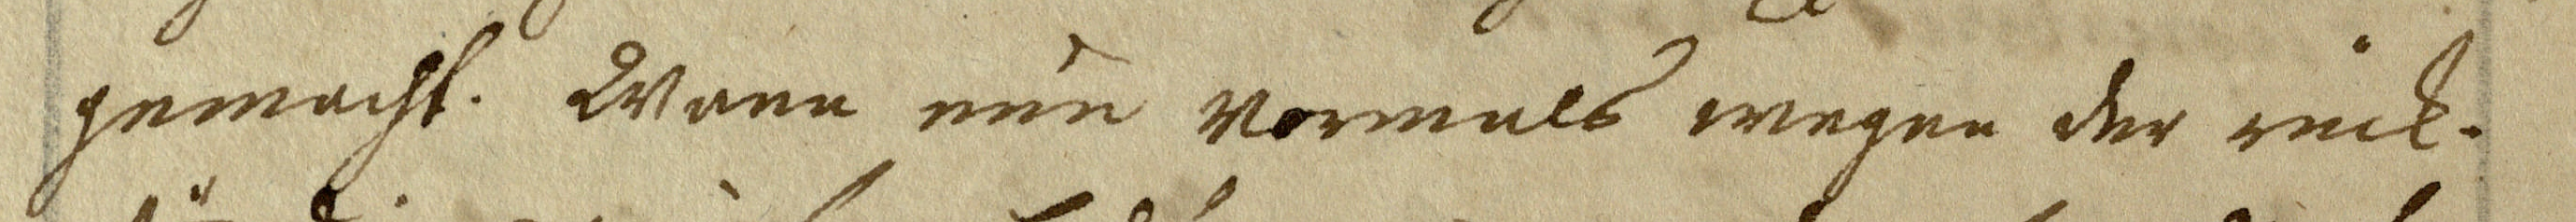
gemacht. Wann nun vormals wegen der rück¬
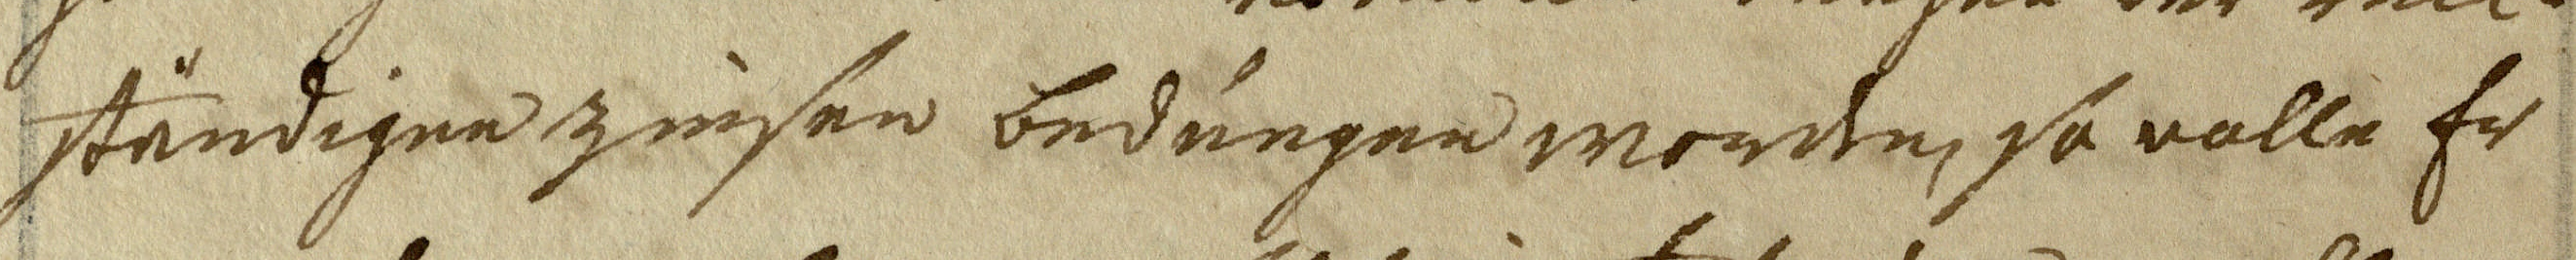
ständigen Zinsen bedungen worden, so wolle Er
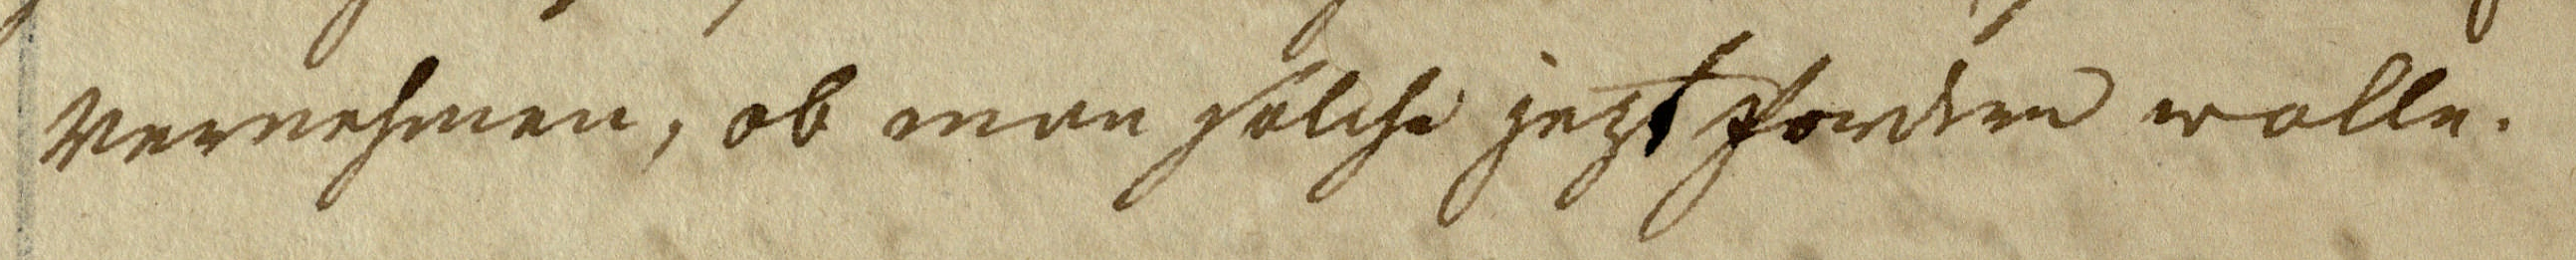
vernehmen, ob man solche jezt fordern wolle.
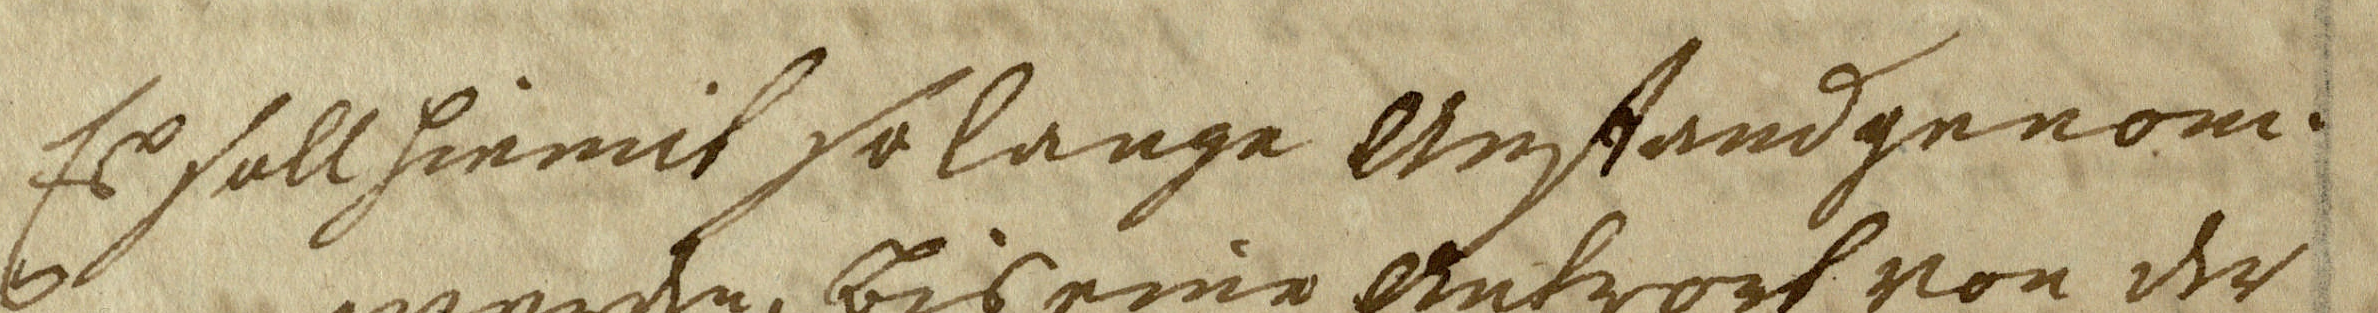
Es soll hiemit so lange Anstand genom¬
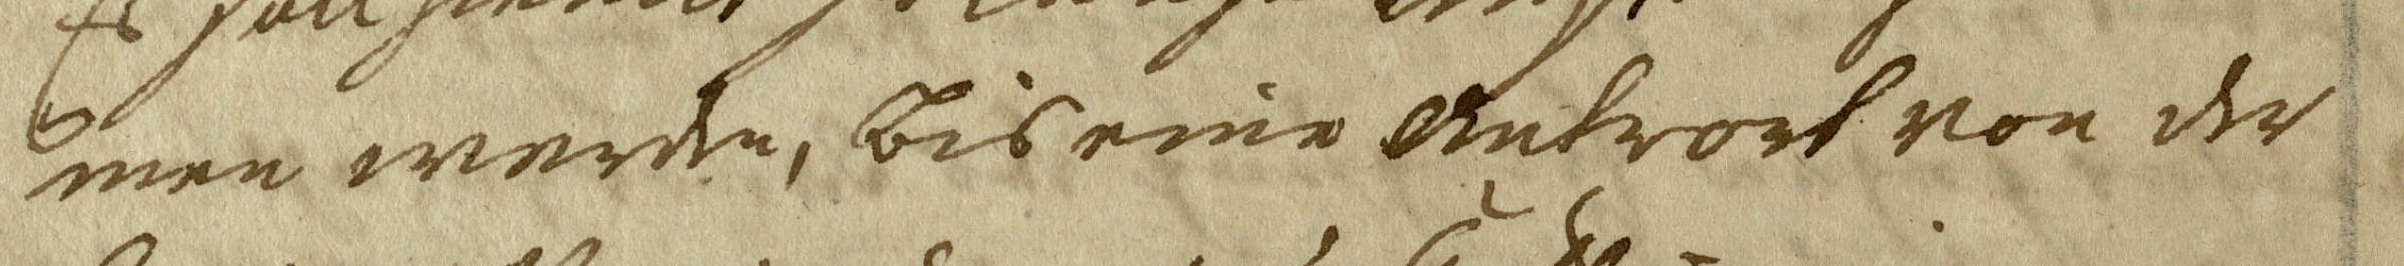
man werden, bis eine Antwort von der
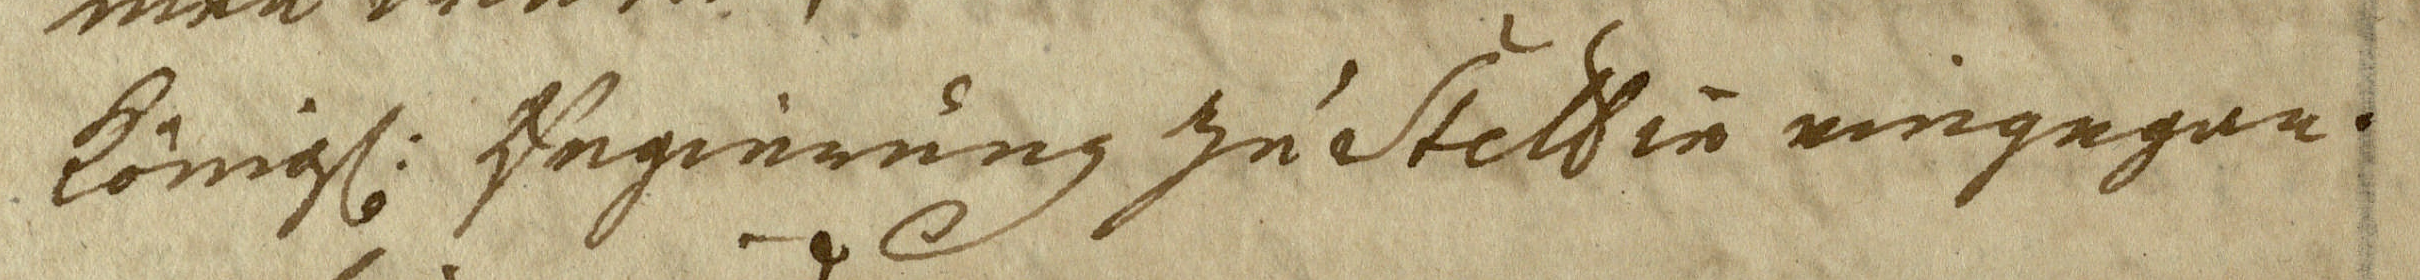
Königl. Regierung zu Stettin eingegan¬
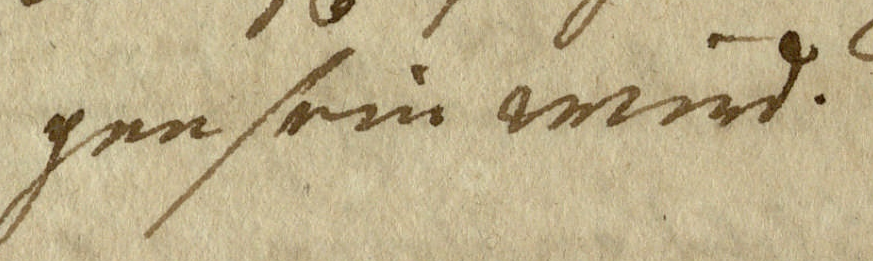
gen sein wird.
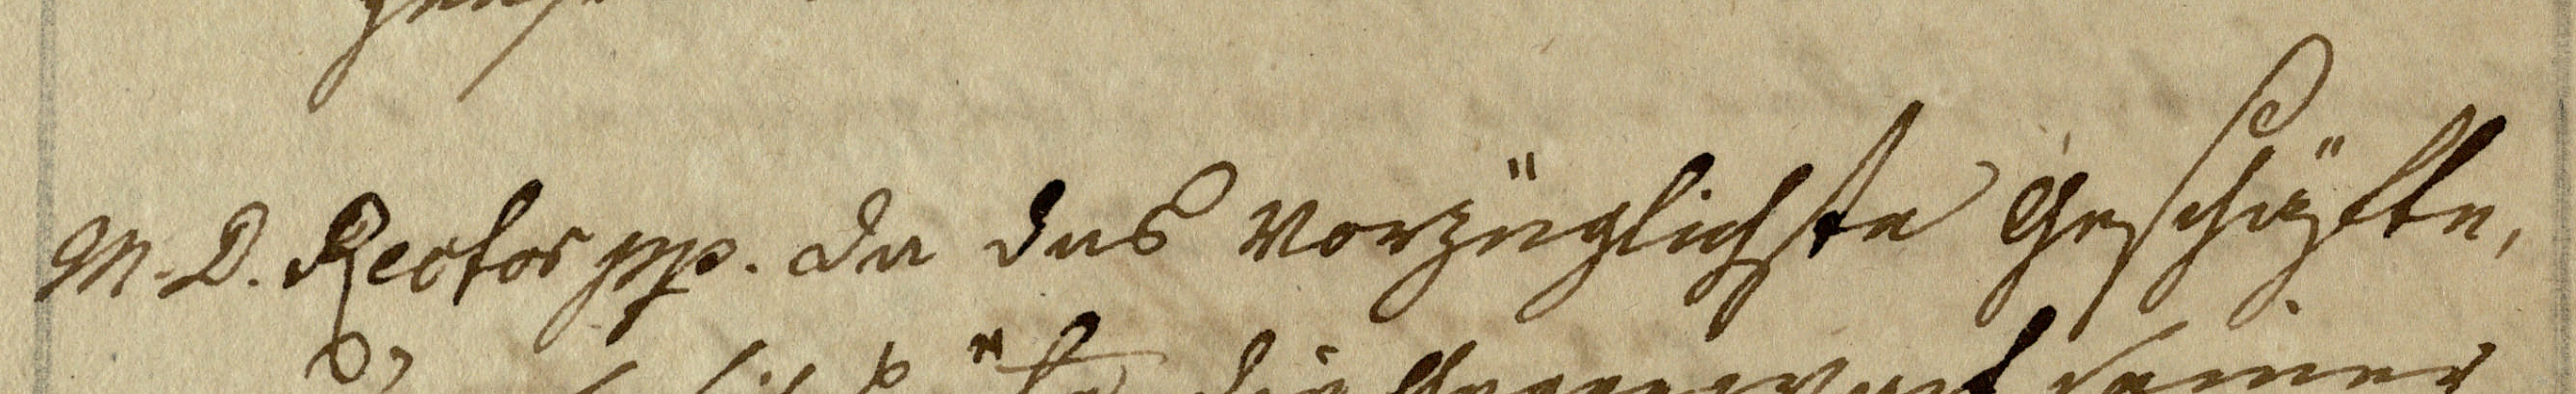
M. D. Rector pp. Da das vorzüglichste Geschäfte
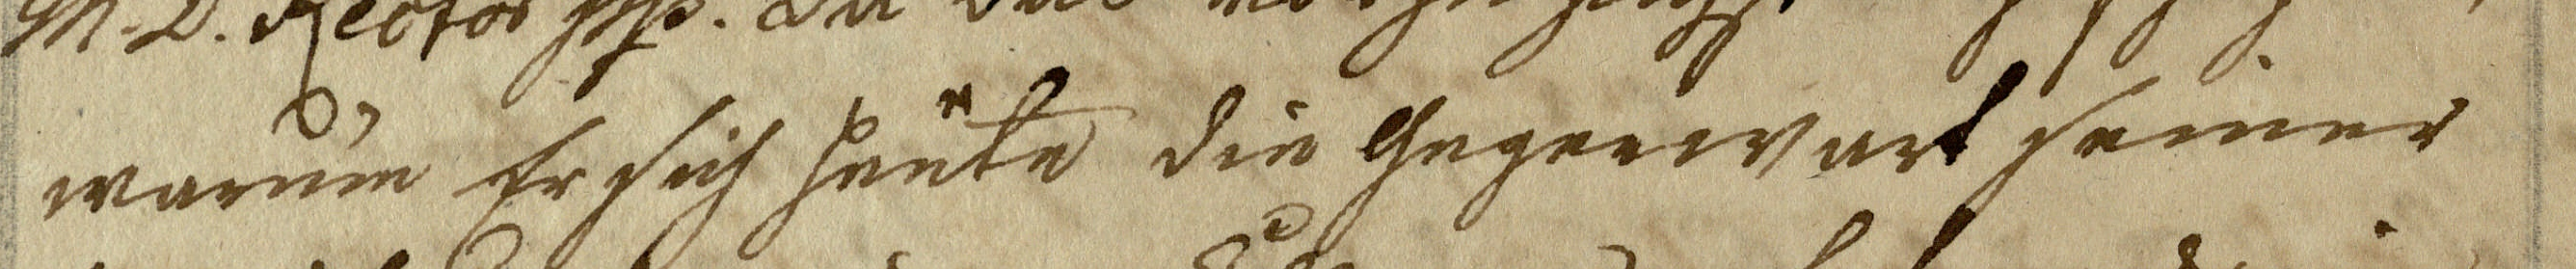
warum Er sich heute die Gegenwart seiner
